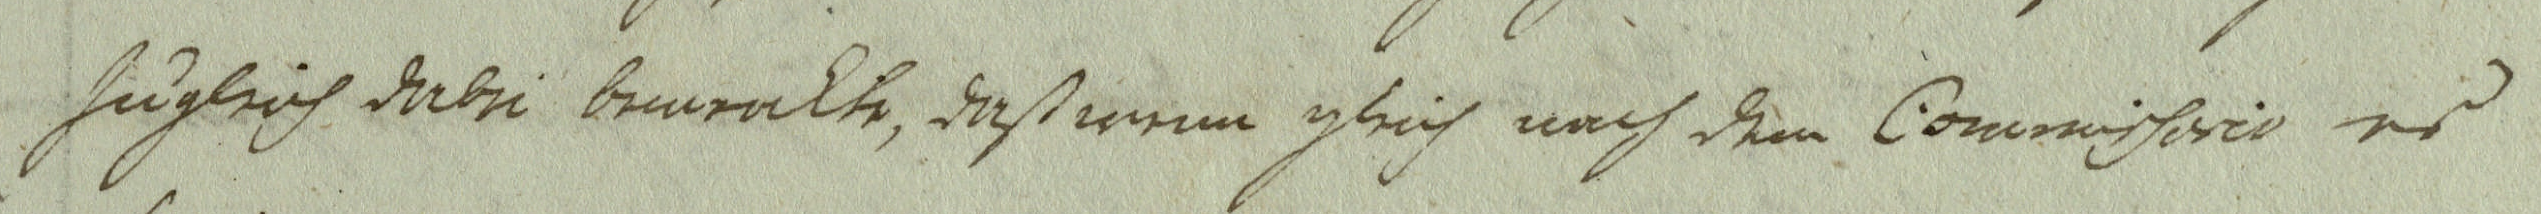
zugleich dabei bemerckte, daß wenn gleich nach dem Commissorio es
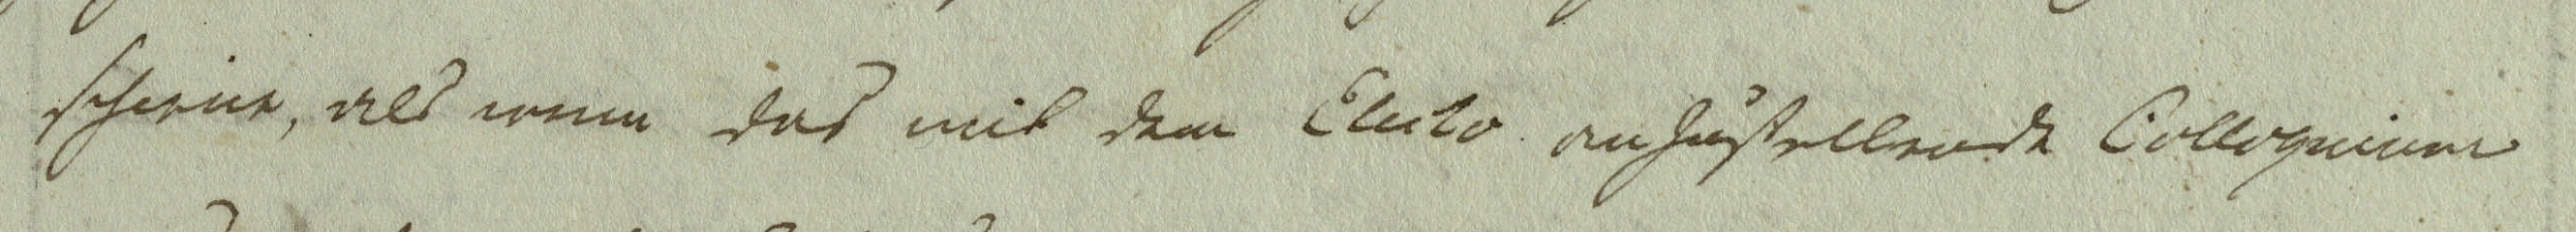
schiene, als wenn das mit dem Electo anzustellende Colloquium
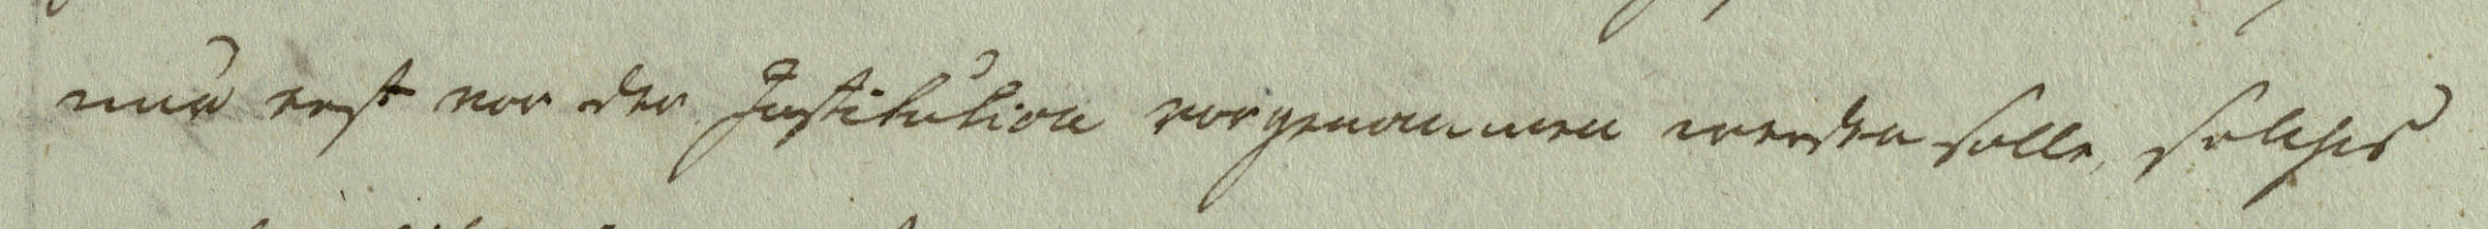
nur erst vor der Institution vorgenommen werden solle, solches
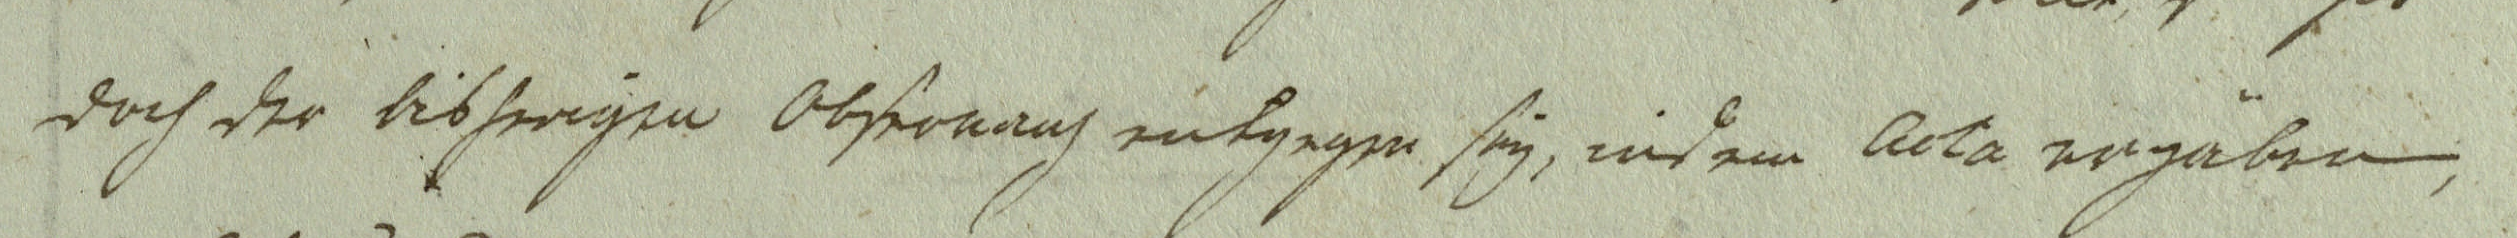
doch der bisherigen Observanz entgegen seÿ, indem Acta ergäben,
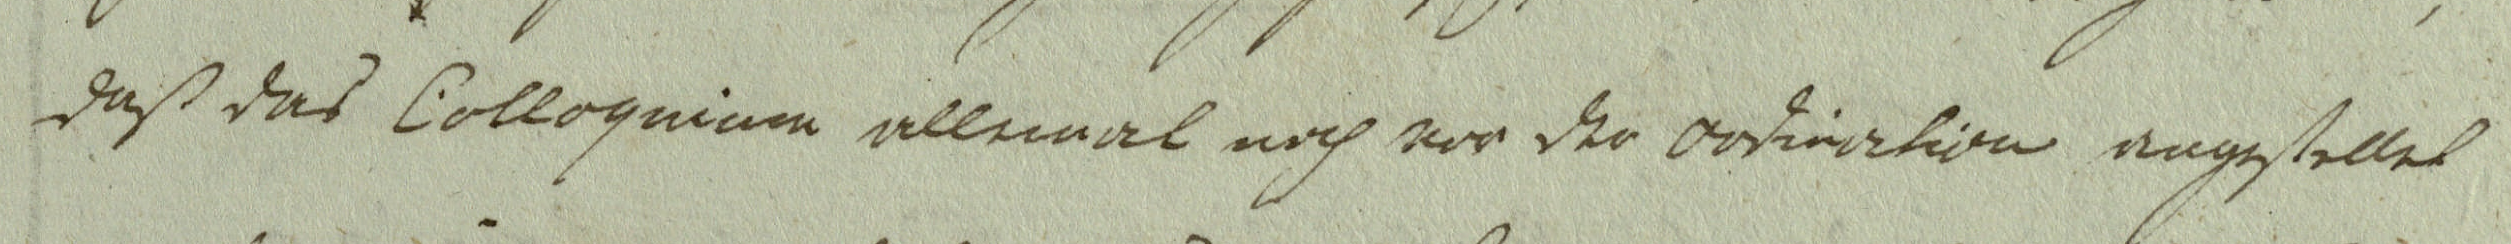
daß das Colloquium allemal noch vor der ordination angestellet
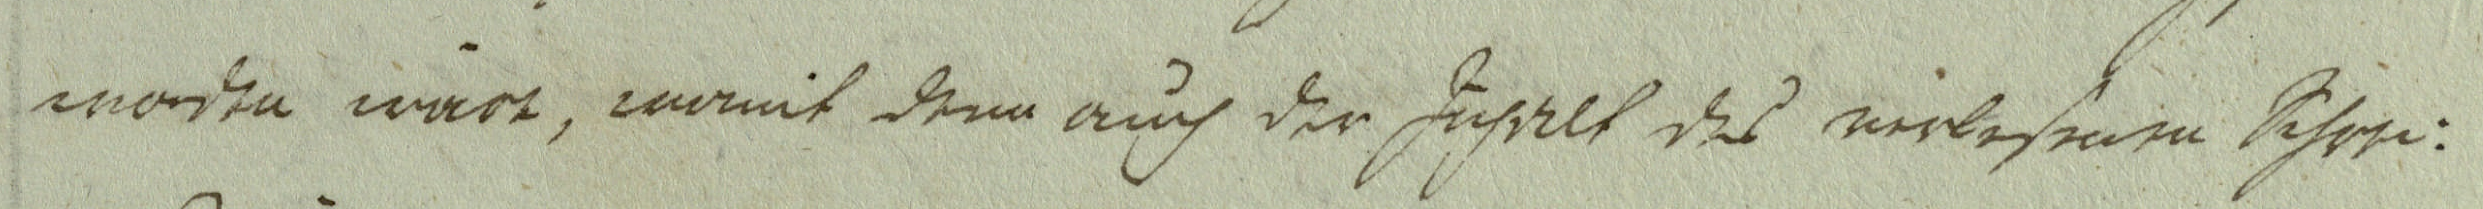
worden wäre, womit denn auch der Inhalt des verlesenen Schrei¬
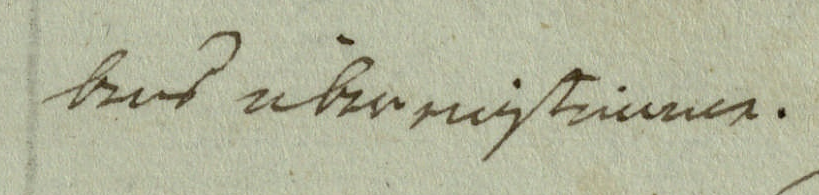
bens übereinstimme.
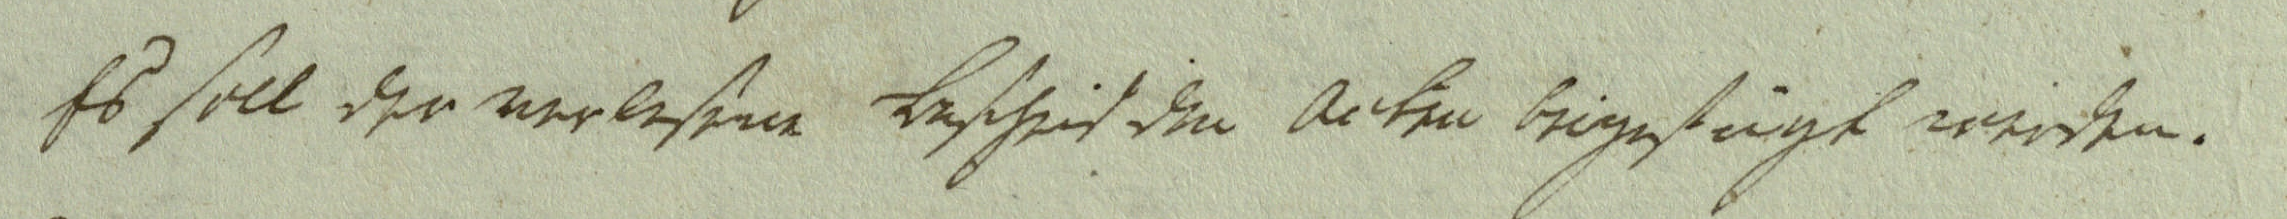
Es soll der verlesene Bescheid den Acten beigefügt werden.
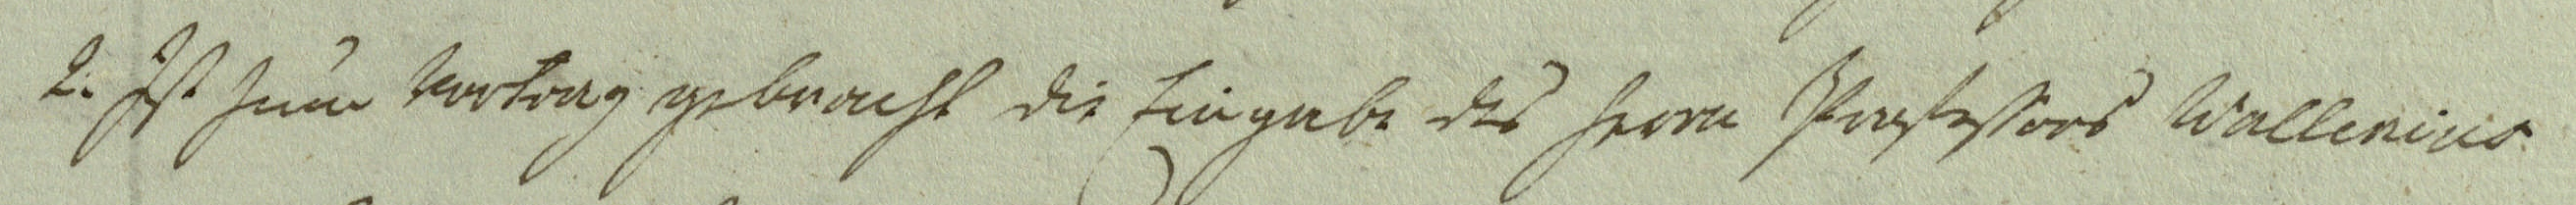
2. Ist zum Vortrag gebracht die Eingabe des herrn Professors Wallenius
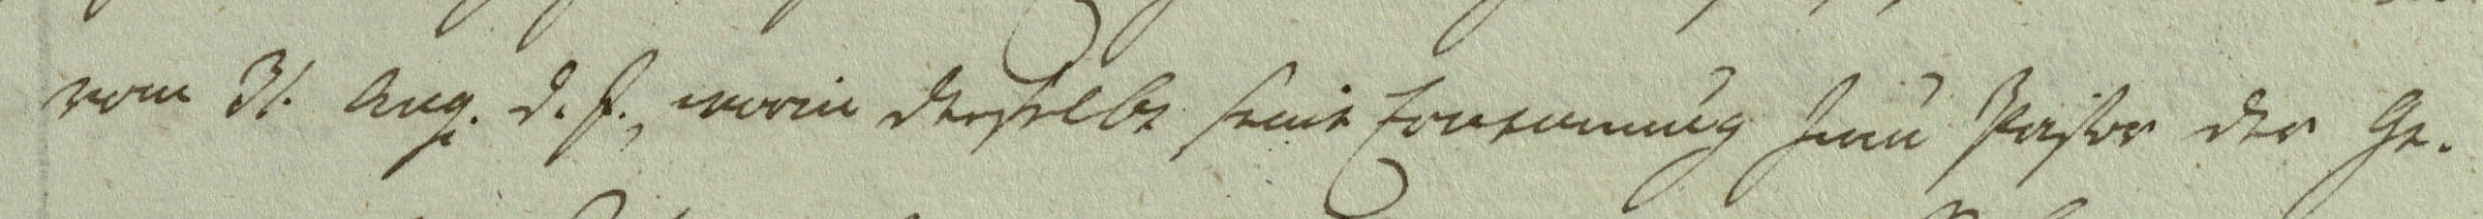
vom 31. Aug. d. J. worin derselbe seine Ernennung zum Pastor der Ge¬
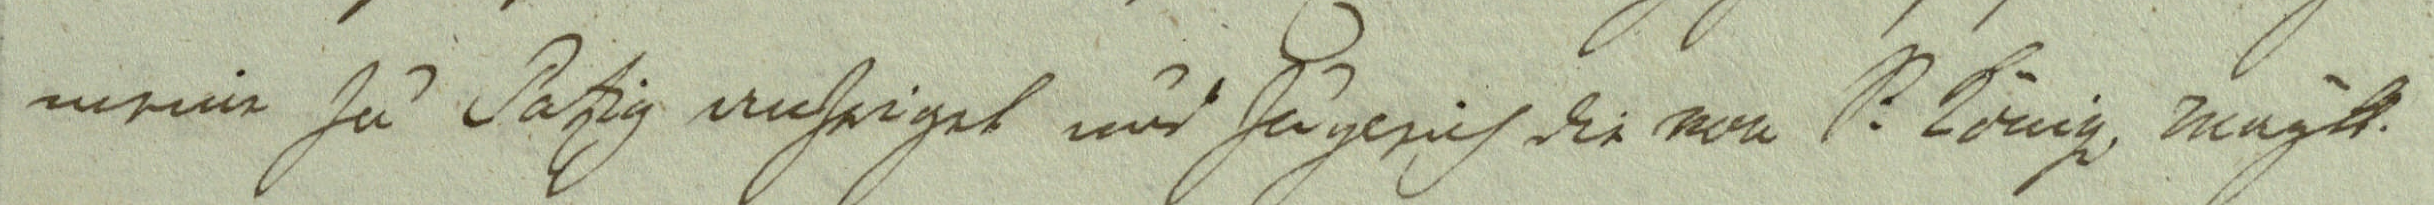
meine zu Patzig anzeiget und zugleich die von Sr. Königl. Maÿtt.
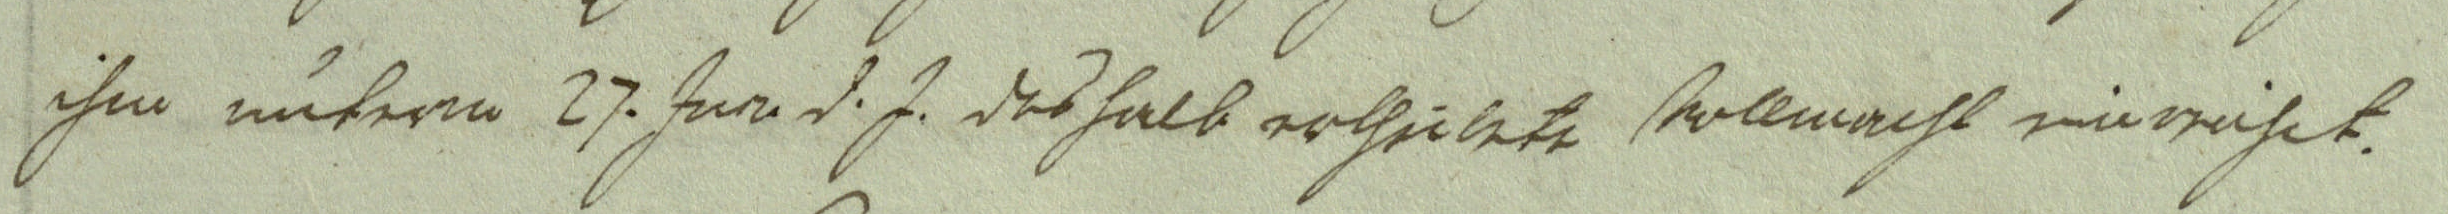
ihm unterm 27. Jun. d. J. deshalb ertheilete Vollmacht einreichet.
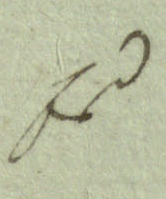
Es
